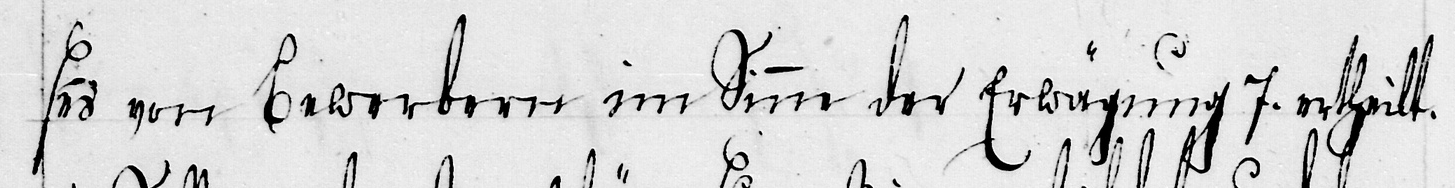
ses von Bewerbern im Sinne der Erwägung 7. ertheilt.
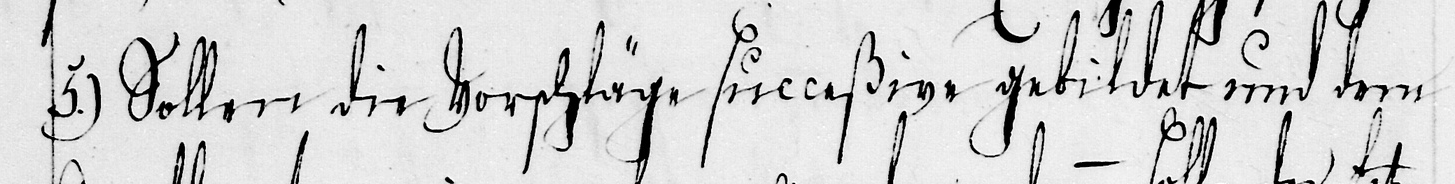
5.) Sollen die Vorschläge succeßive gebildet und dem
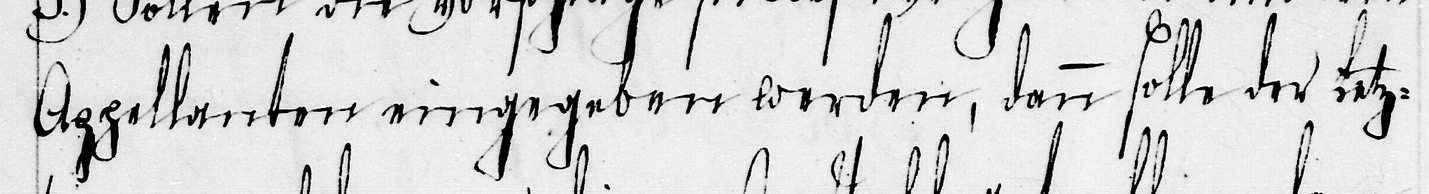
Appellanten eingegeben werden, dann solle der Letz¬
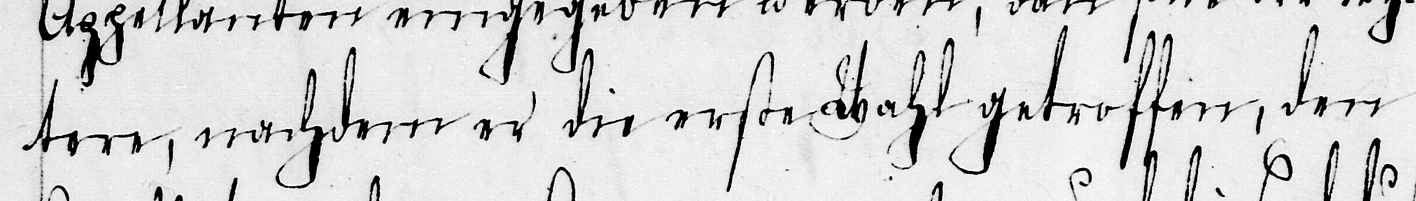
tere, nachdem er die erste Wahl getroffen, den
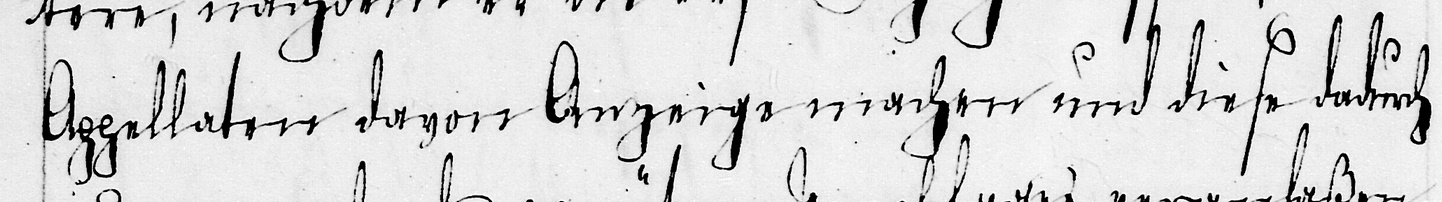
Appellaten davon Anzeige machen und diese dadur¬
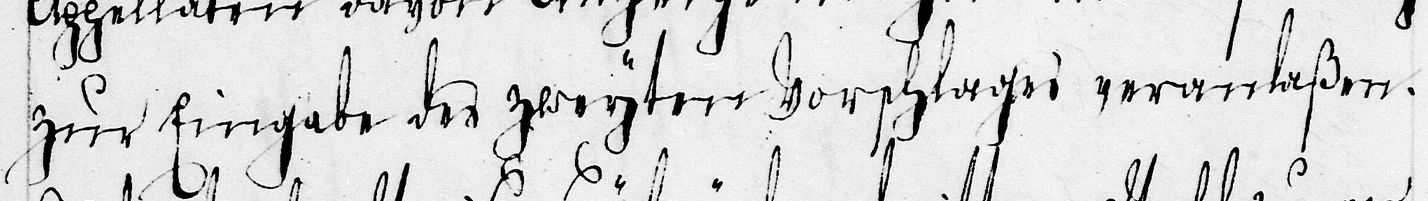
zur Eingabe des zweyten Vorschlages veranlaßen.
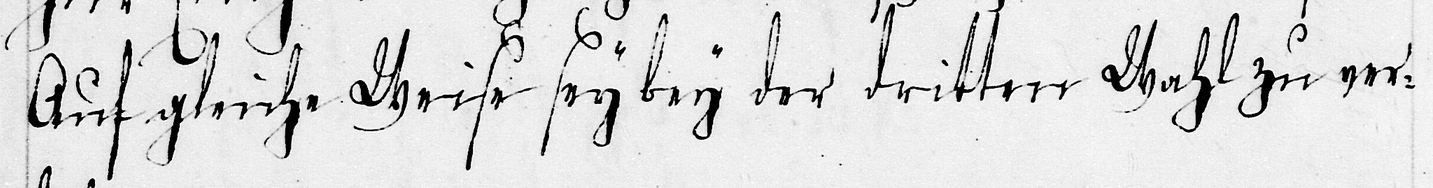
Auf gleiche Weise sey bey der dritten Wahl zu ver¬
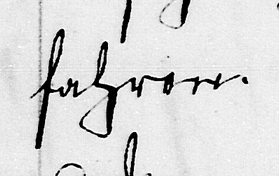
fahren.
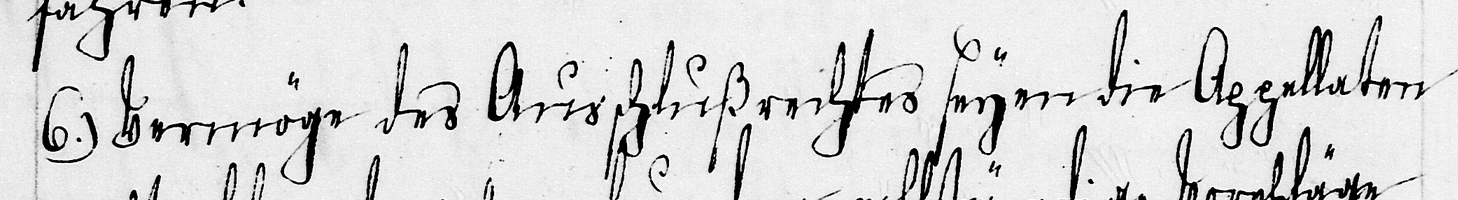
6.) Vermöge des Ausschlußrechtes seyen die Appellaten
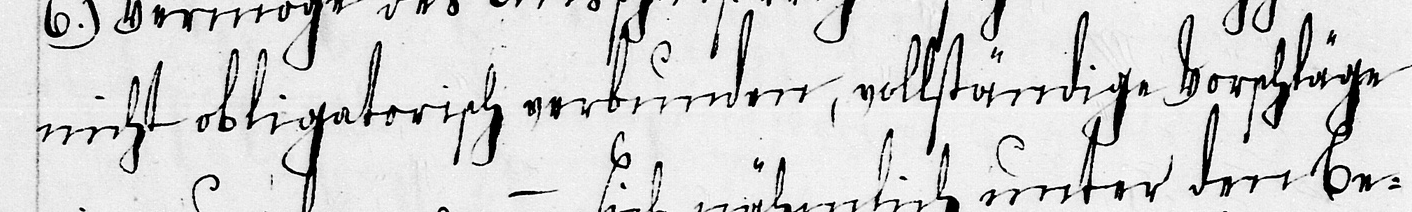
nicht obligatorisch verbunden, vollständige Vorschläge
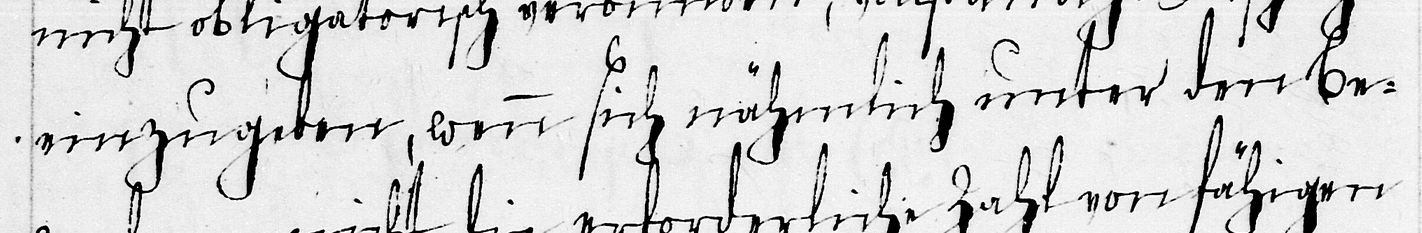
einzugeben, wenn sich nämlich unter den Be¬
